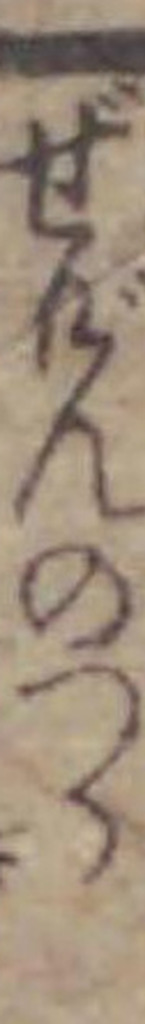ぜげんのつら
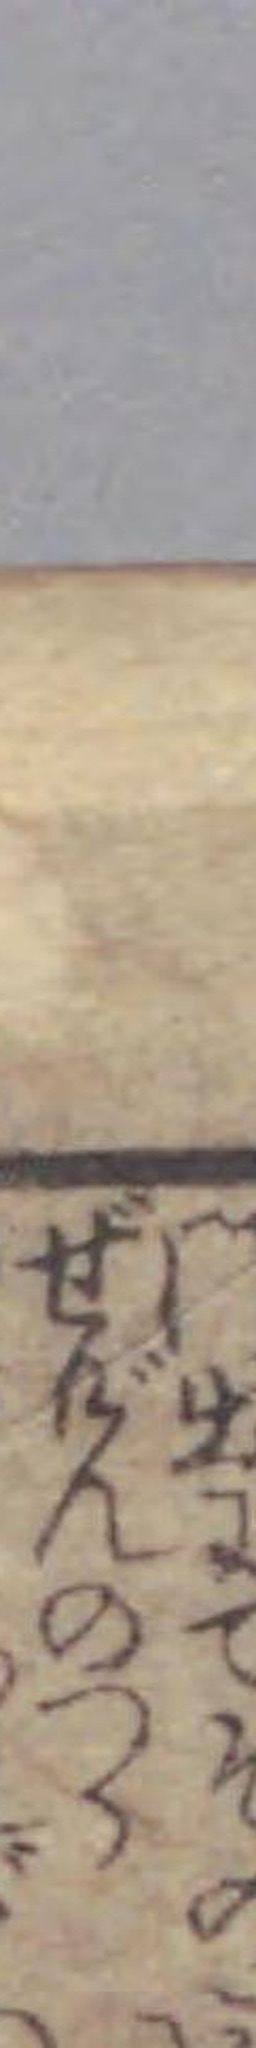ぜげんのつら
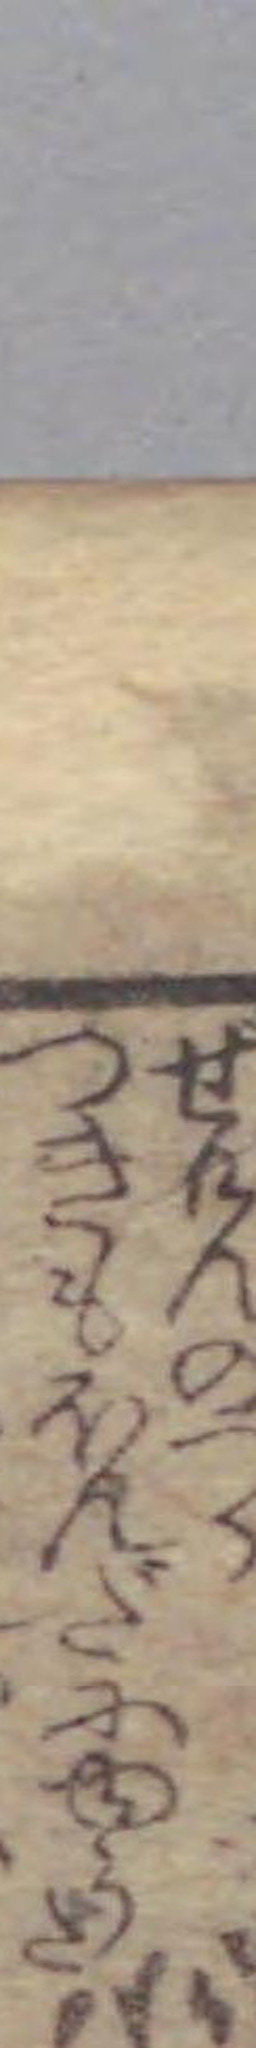つきもほんだにゆうた
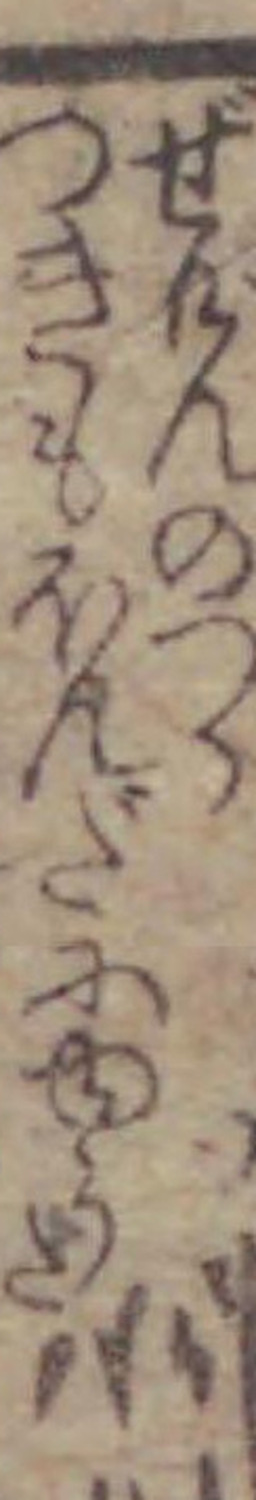つきもほんだにゆうた
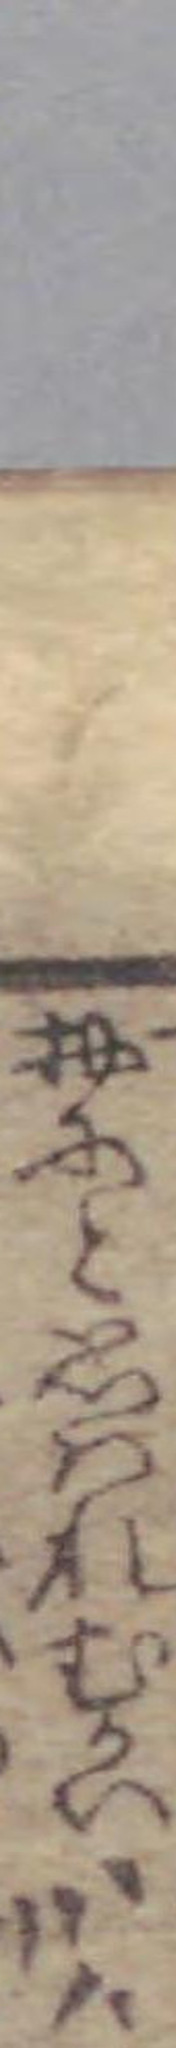おにと思はれむかい
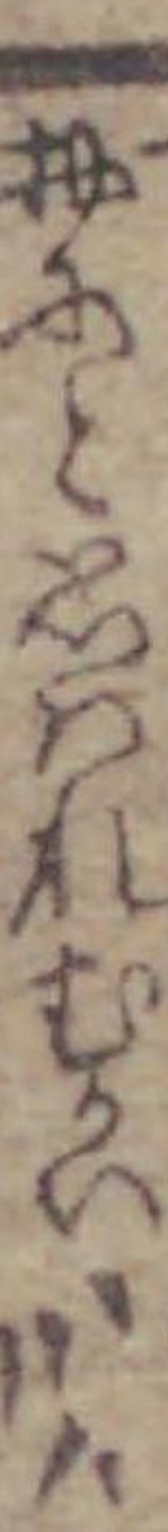おにと思はれむかい
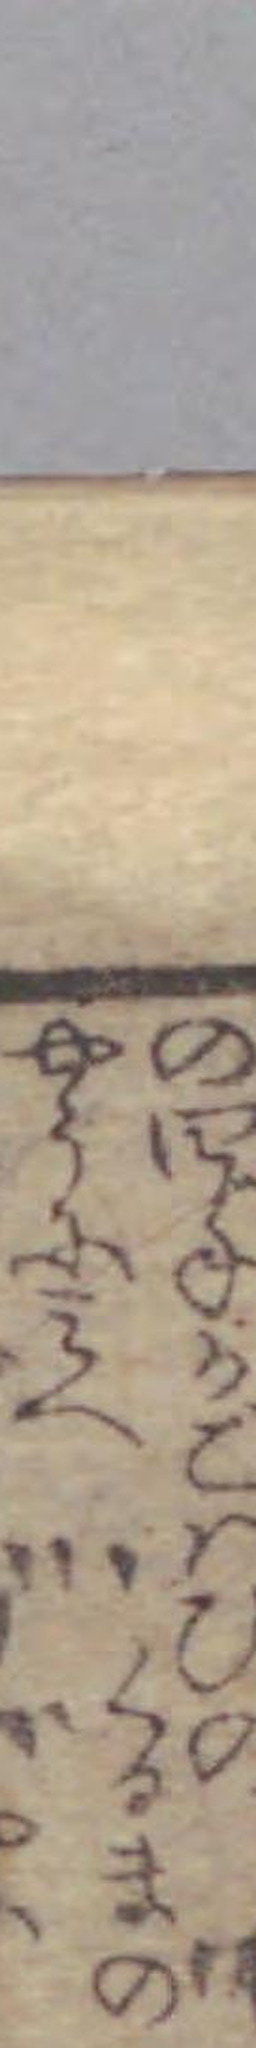やうにみへ
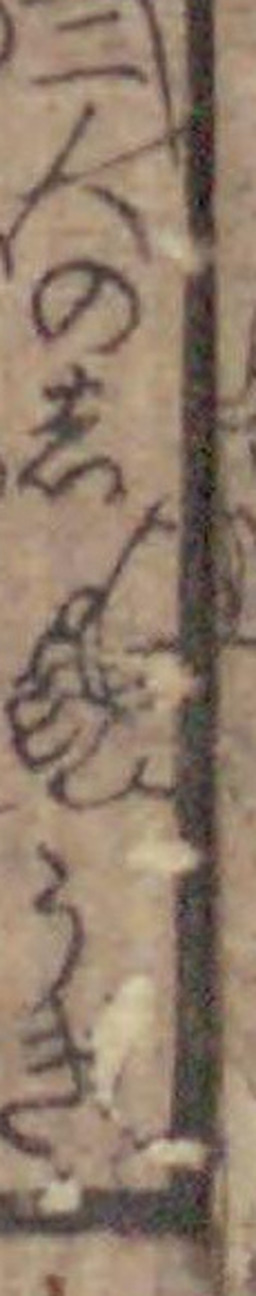「二人のしうき
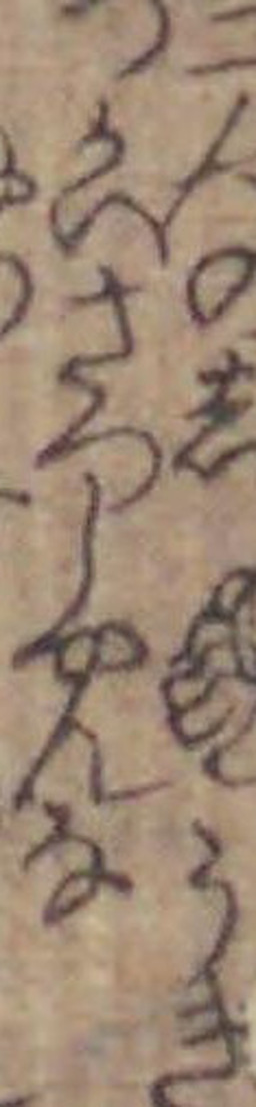づかいさつしやんな
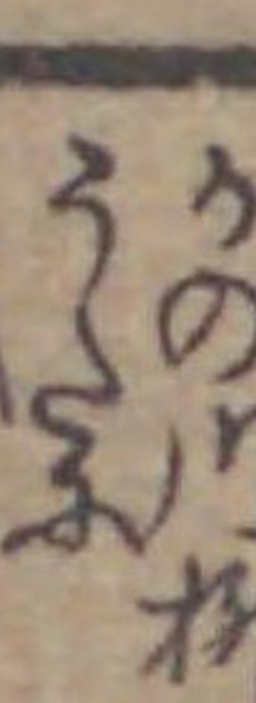うたに
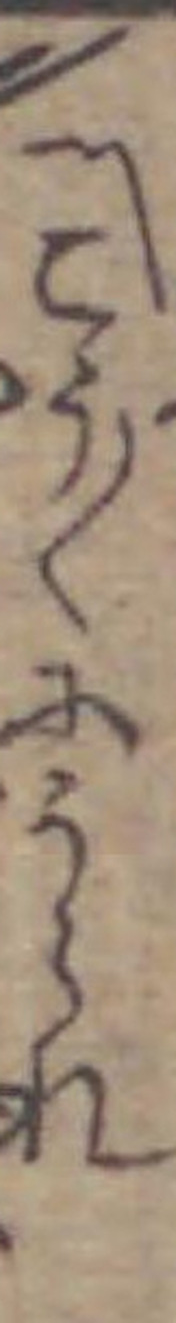「こう〳〵にうられ
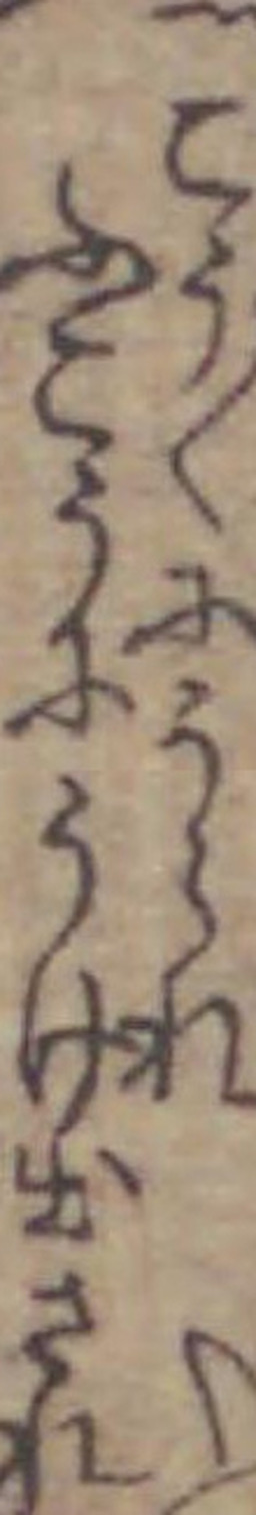ふこうにうけ出され
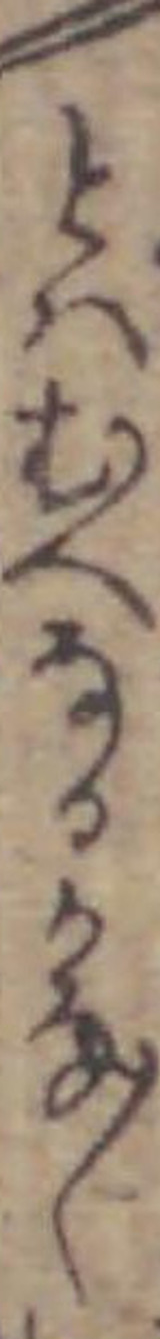とはむへなるかな〳〵
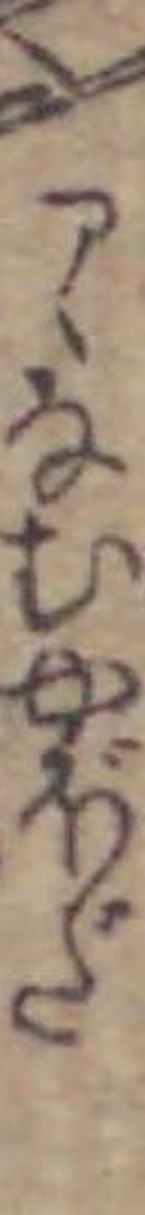アゝなむやぼだ
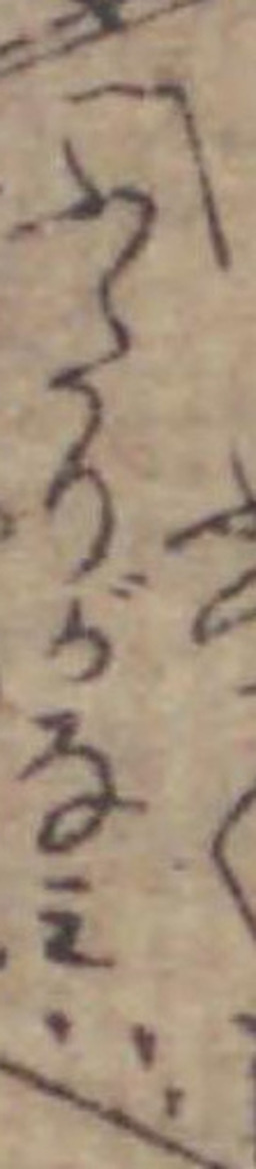「ふたりがなみ
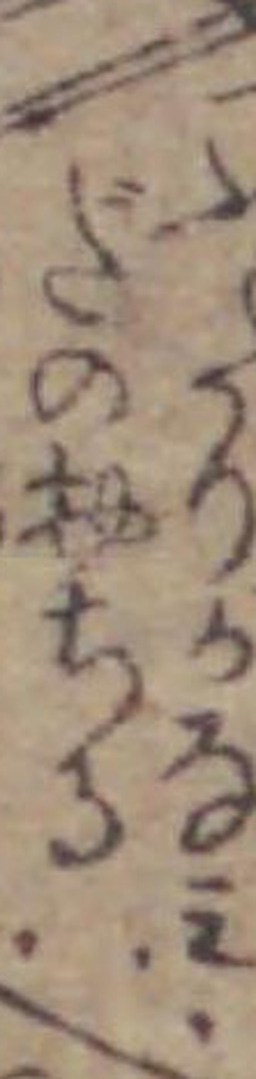だのおちる
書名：九替十年色地獄 : 3巻
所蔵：国立国会図書館 National Diet Library, JAPAN
